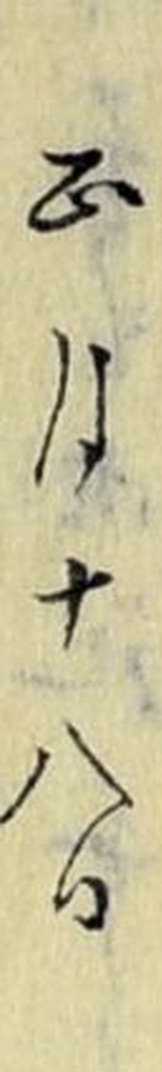正月十八日
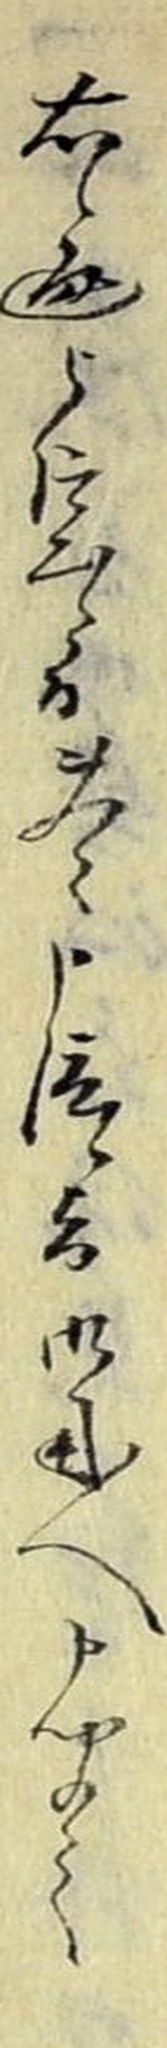右之通被仰出候に付夫々申渡候旨御用人申聞之
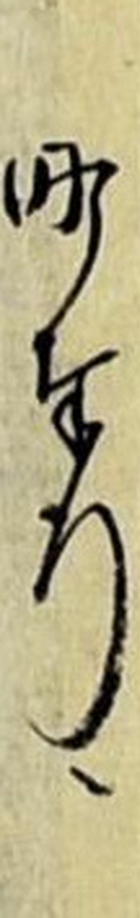御奉行
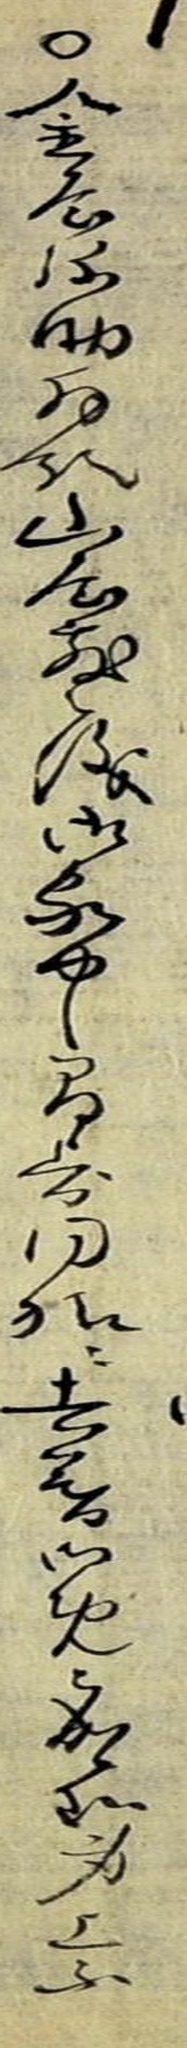○金屋弥助拝領山屋敷之儀御家中間歩同様に去暮御免被成候処身上不
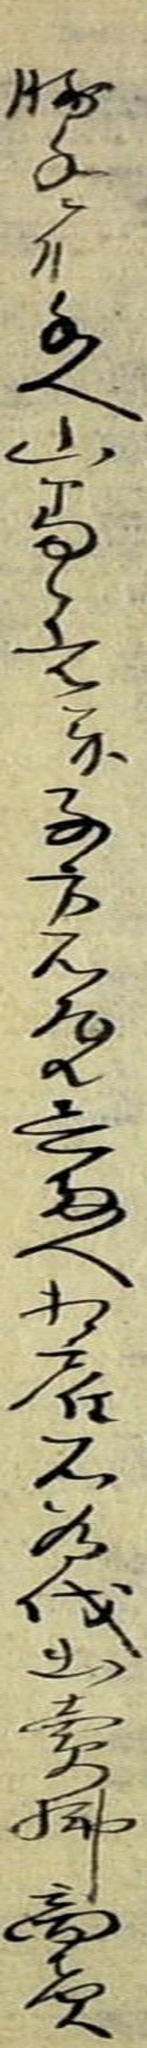勝手に付手入山番之者并子方石屋共壱両人相雇石為伐出売払商売
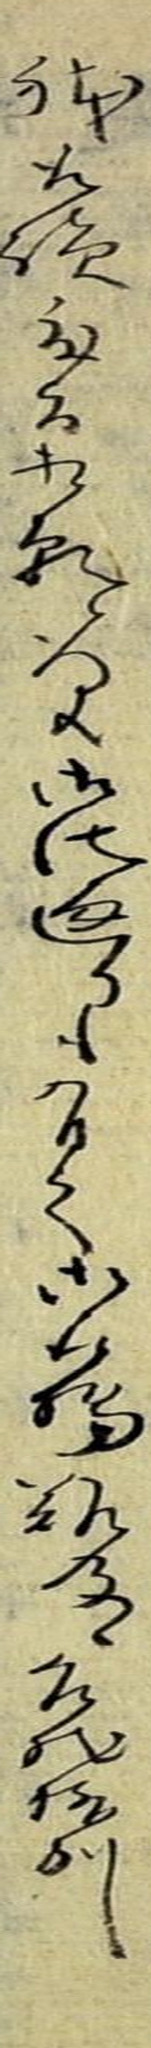体取続度旨相願候得共御法通りも有之御取揚難及候乍然格別
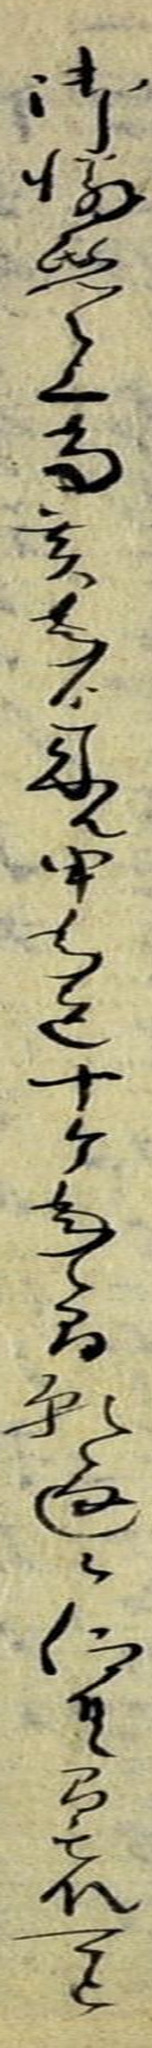御憐愍之上当亥年ゟ来申年迄十ヶ年之間願之通被仰付候間其段可被
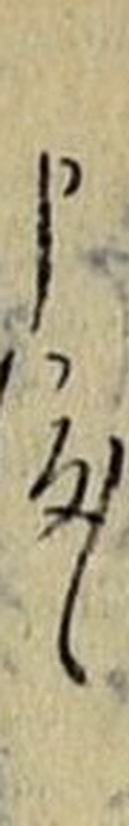申渡候
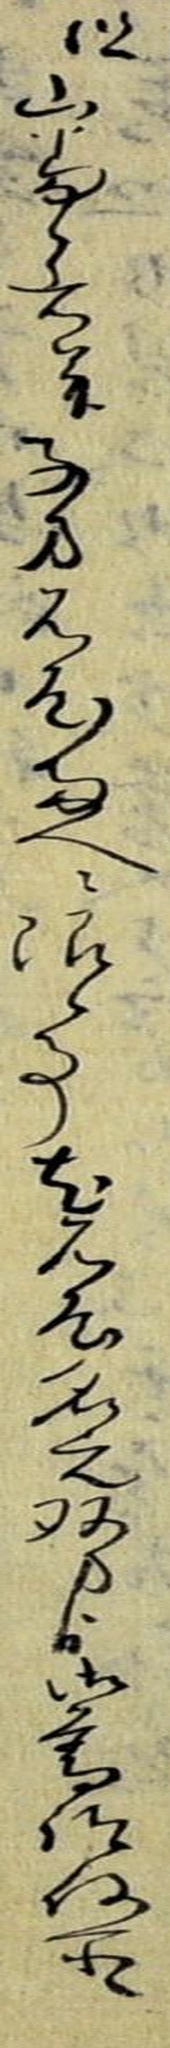但山番之者并子方石屋両人に限り候事尤石屋名元双方ゟ御普請役所へ
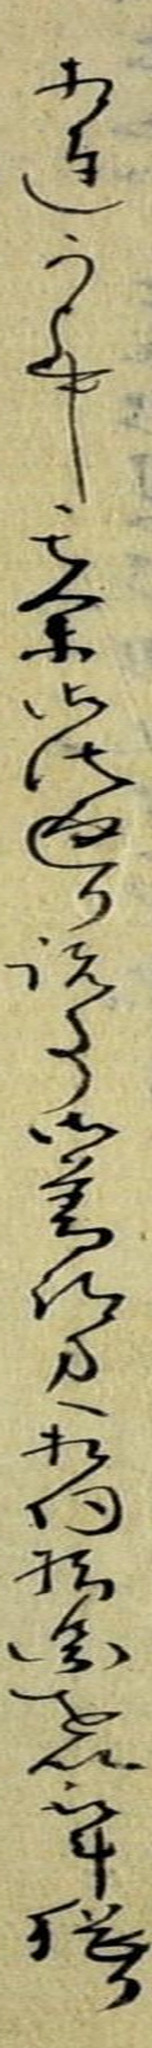相達可申事其余御法通り諸事御普請方へ相伺指図を以取斗猥り
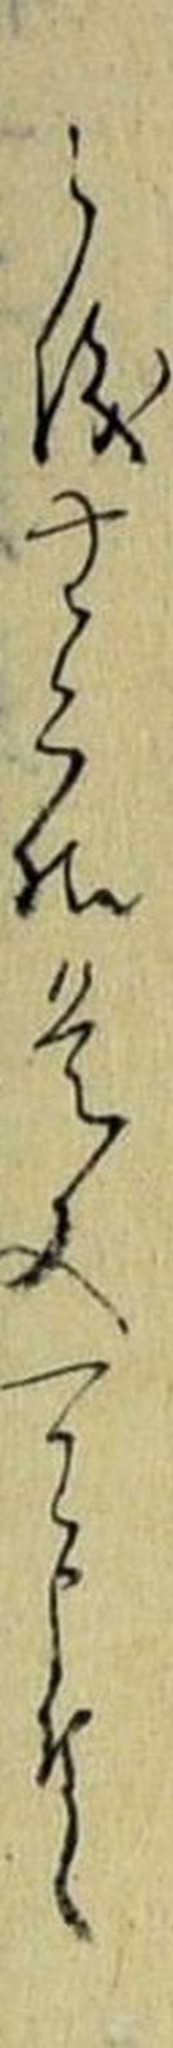之義無之様是又可被申付候
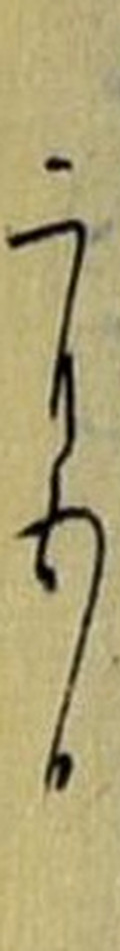二月五日
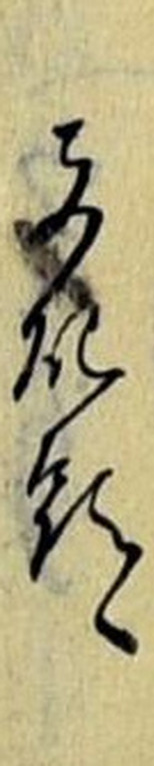支配頭へ
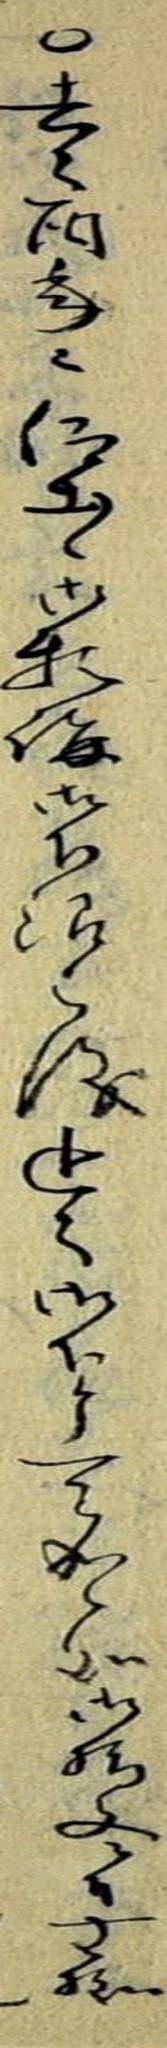○去々酉年被仰出候御頼講御下銀之儀追々御下ヶ可被成候処御指支に付無拠
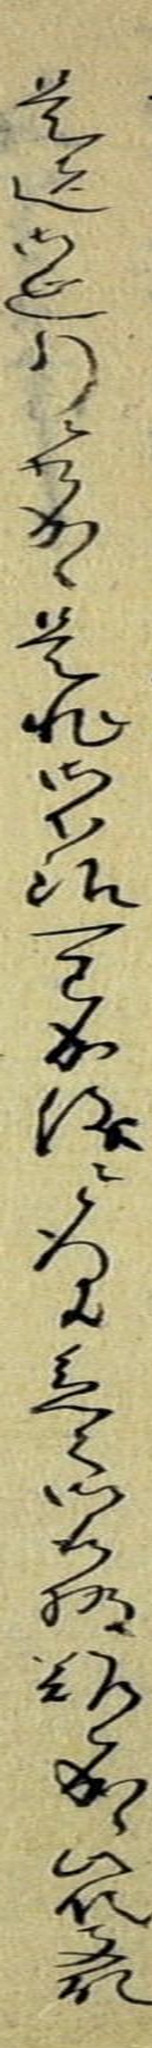是迄御延引に相成候是非御下銀可被成儀に候得共兼々御取扱難被成候此段支配
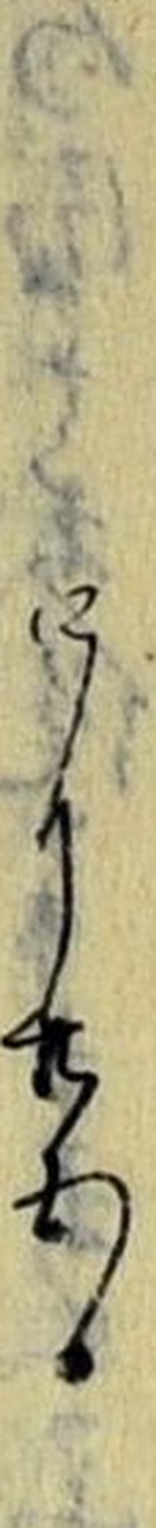四月廿五日
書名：命令之部 四
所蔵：福井県文書館 Fukui Prefectural Archives
